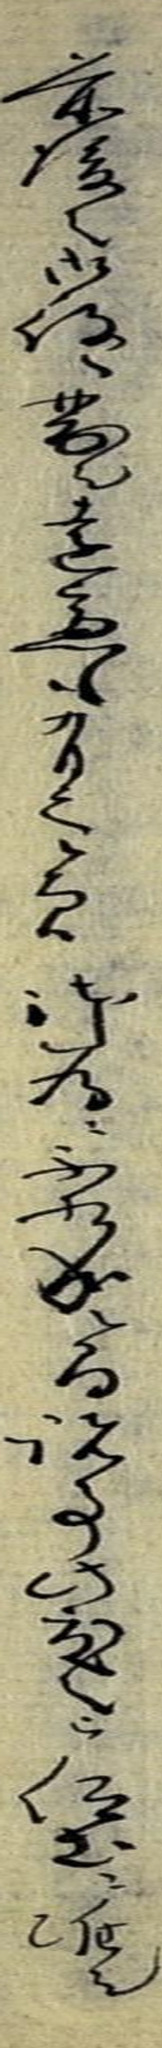前後之御役へ対し遠慮も有之候而は御為に不相成候間諸事此度之被仰出に准し
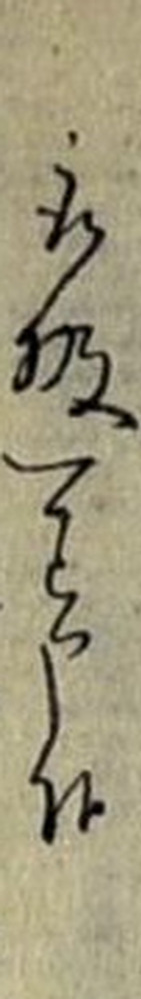取扱可被申候
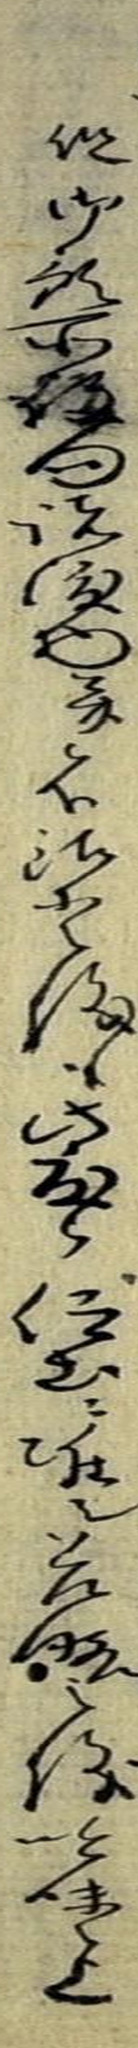但御預所役向諸渡物并被下銀等之儀も此度被仰出に准し差略之儀吟味之上
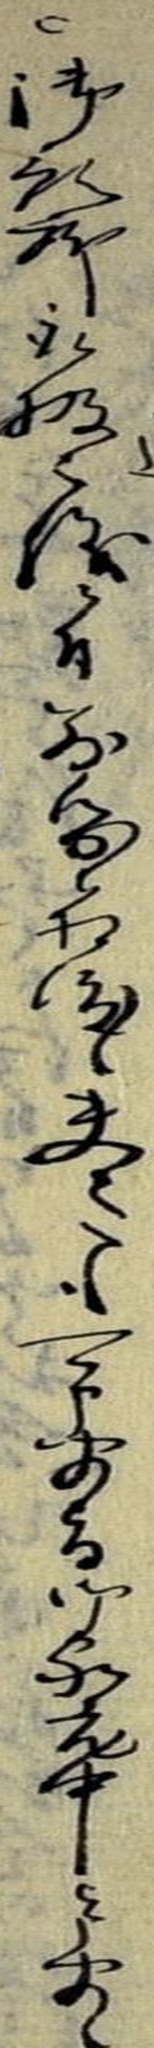〇御預所取扱之儀に付別紙被相渡候夫々へも可申聞旨御家老中被申聞候
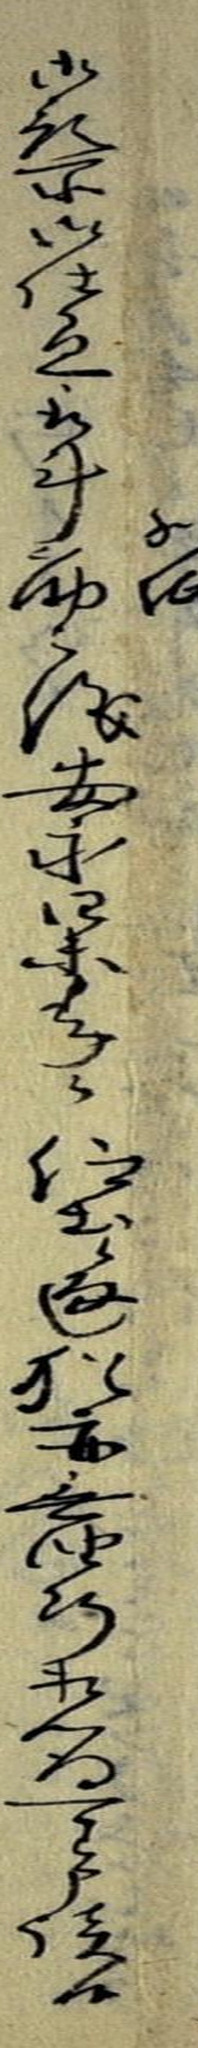御預所御仕置取斗筋之儀安永四未年被仰出候通猶亦無油断相心得可被申談候
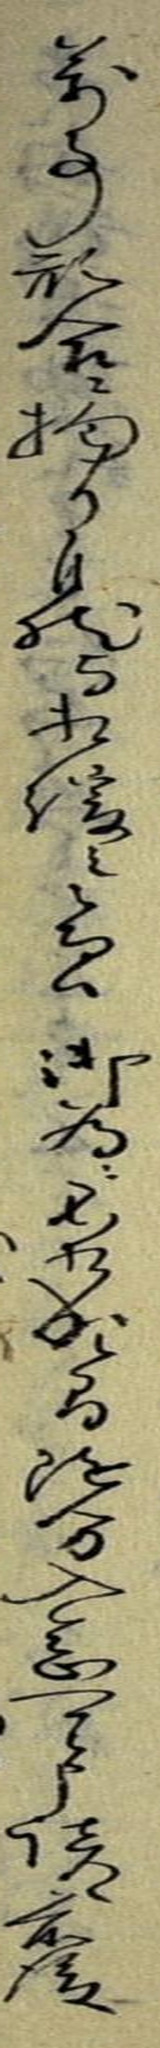万事形合に拘り自然与相緩み候而は御為に不相成候間随分入念可被申談候前後
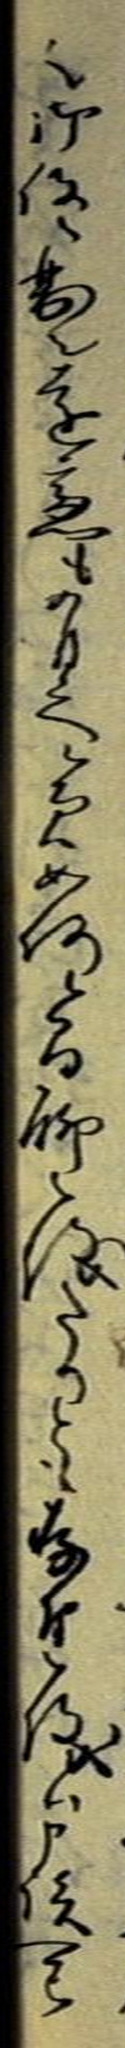之御役へ対し遠慮も有之候而は如何候間聊之儀たりとも存付候儀は申談可被
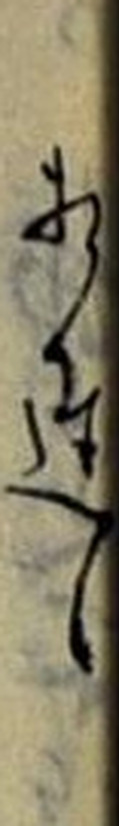相達候
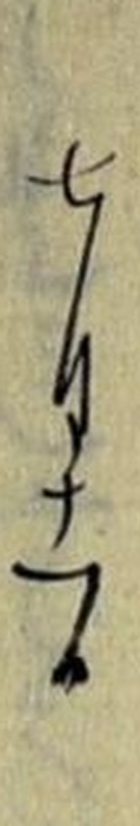七月十一日
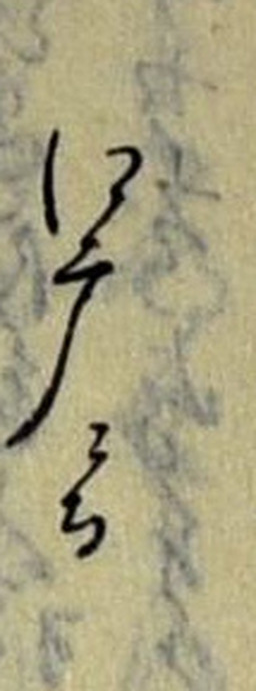江戸に而
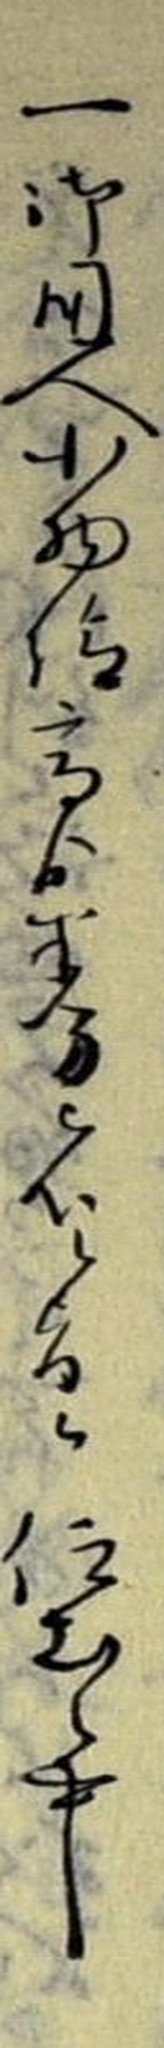一御用人小物給高ゟ半分被下候旨被仰出之事
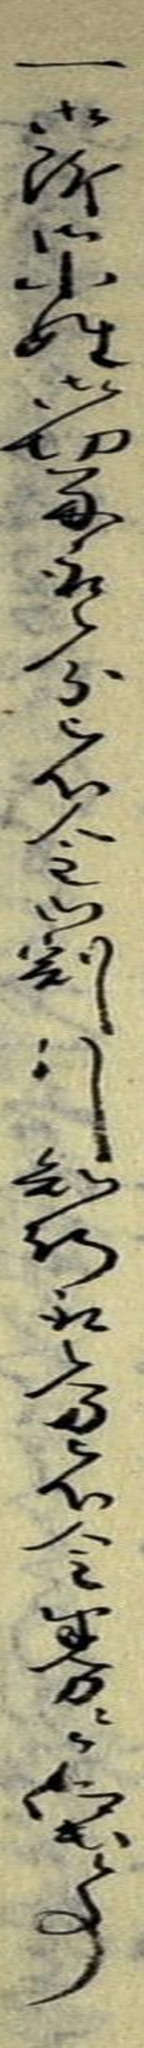一御附御小姓御切米取之分被下金弐割引知行取之之分被下金半分に被仰出候事
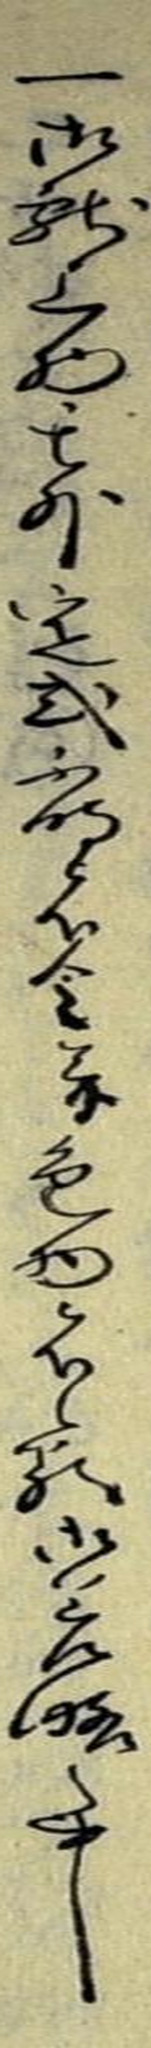一御献上物其外定式不時被下金并色物被下候類御差略之事
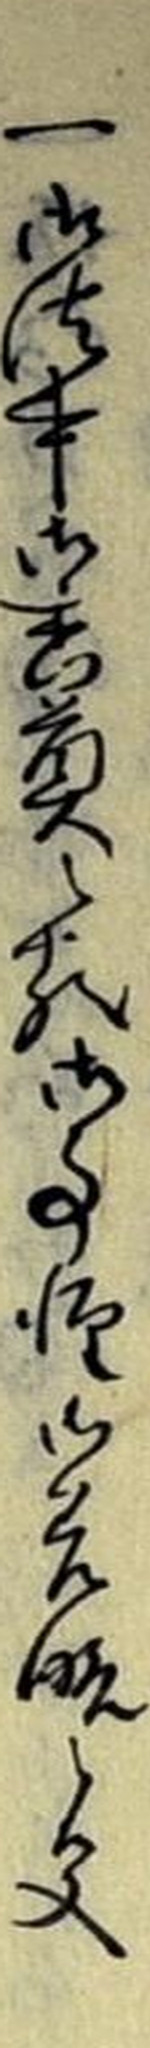一御法事御香奠之類御事軽御差略之事
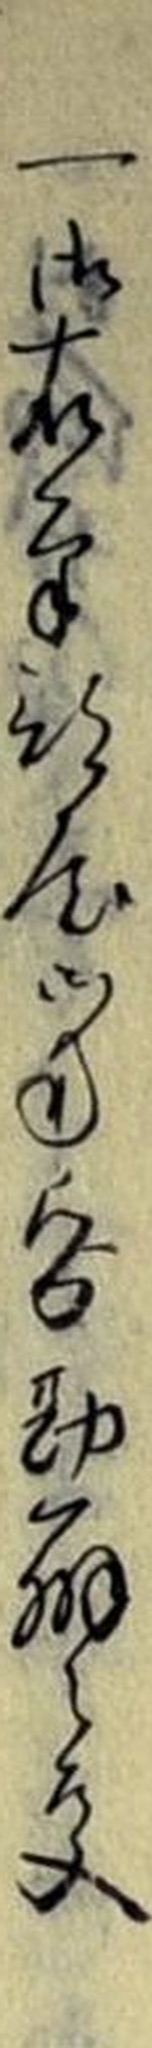一御祐筆部屋御用紙勘弁之事
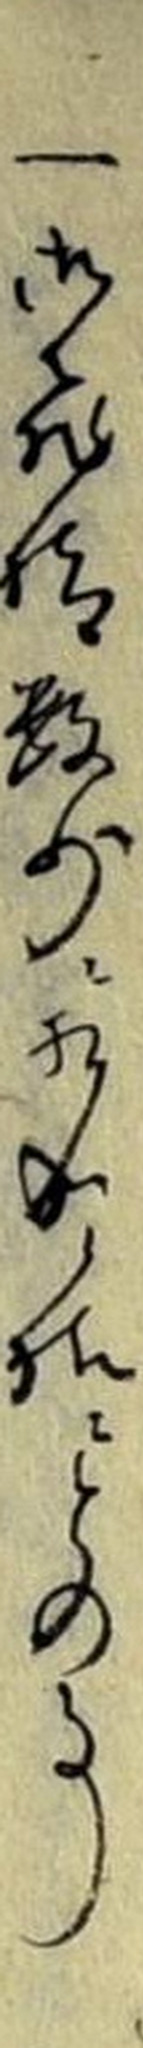一御飛脚数少に相成候様にとの事
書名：命令之部 二
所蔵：福井県文書館 Fukui Prefectural Archives
